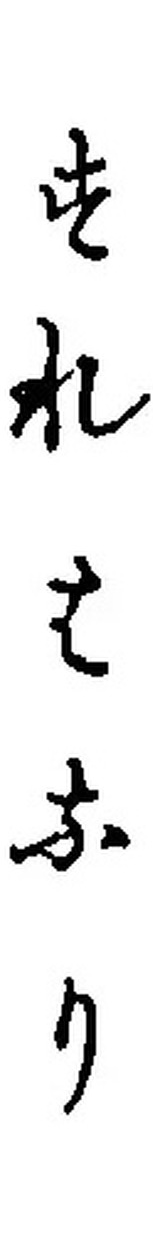すれはなり
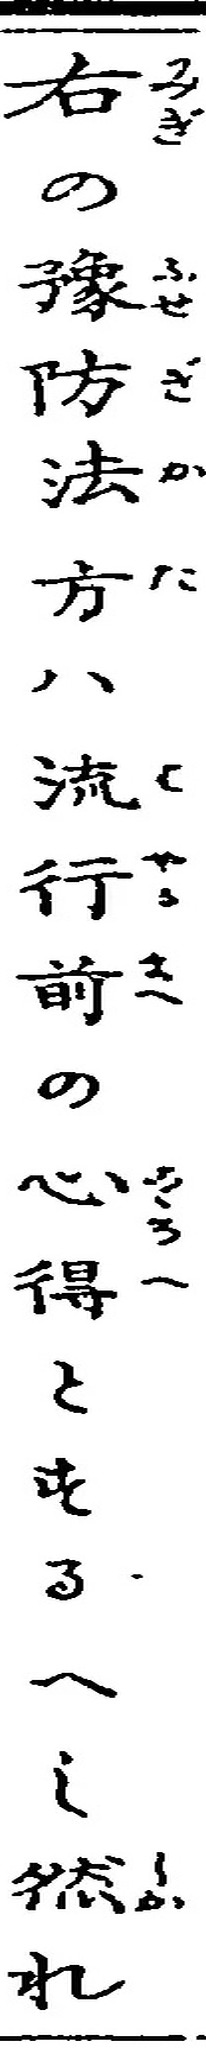右の豫防法方は流行前の心得とするへし然れ
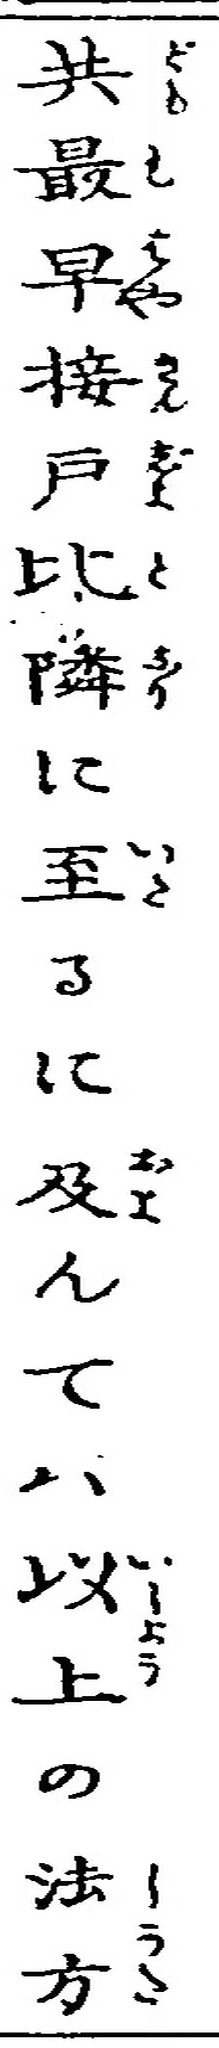共最早接戸比隣に至るに及んては以上の法方
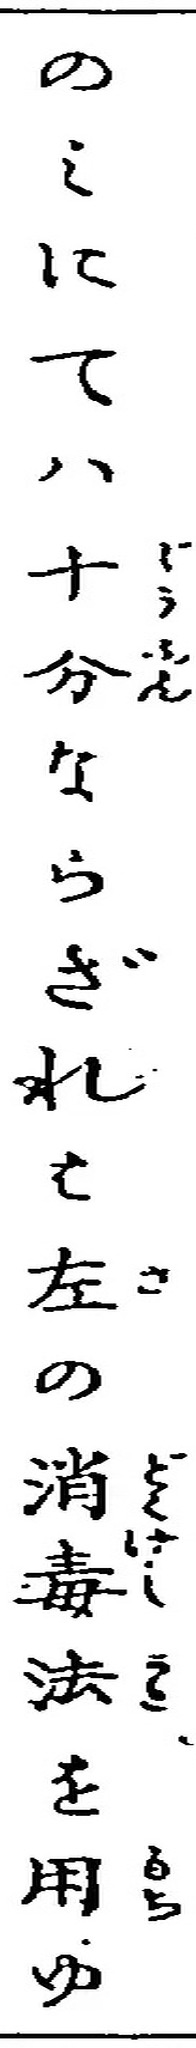のみにては十分ならざれは左の消毒法を用ゆ
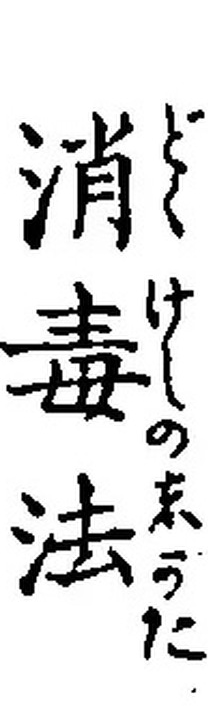消毒法
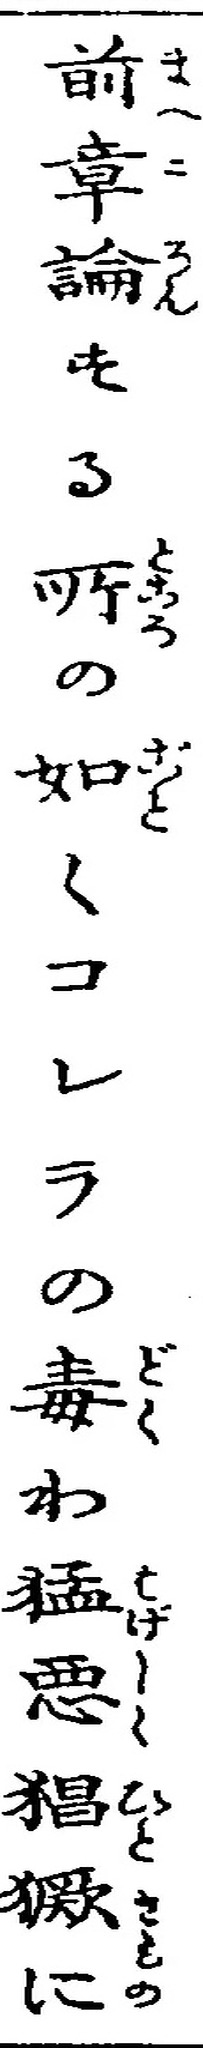前章論する所の如くコレラの毒わ猛悪猖獗に
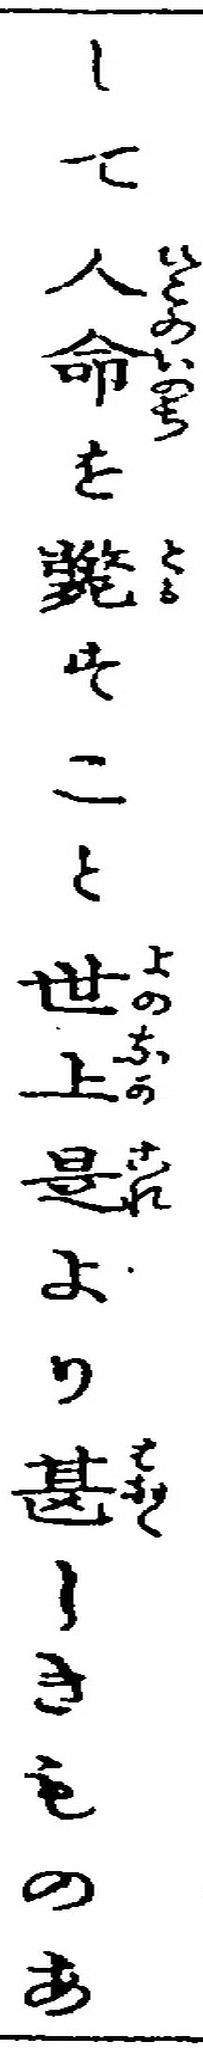して人命を斃すこと世上是より甚だしきものあ
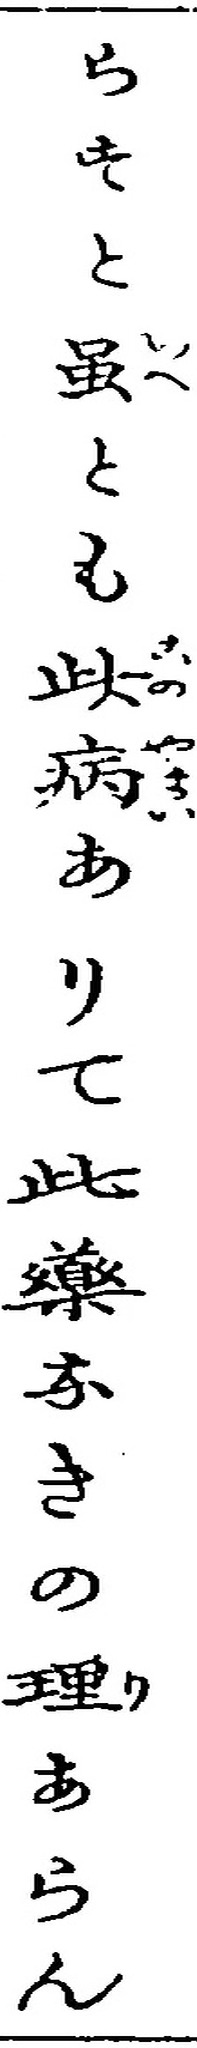らすと雖とも此病ありて比藥なきの理あらん
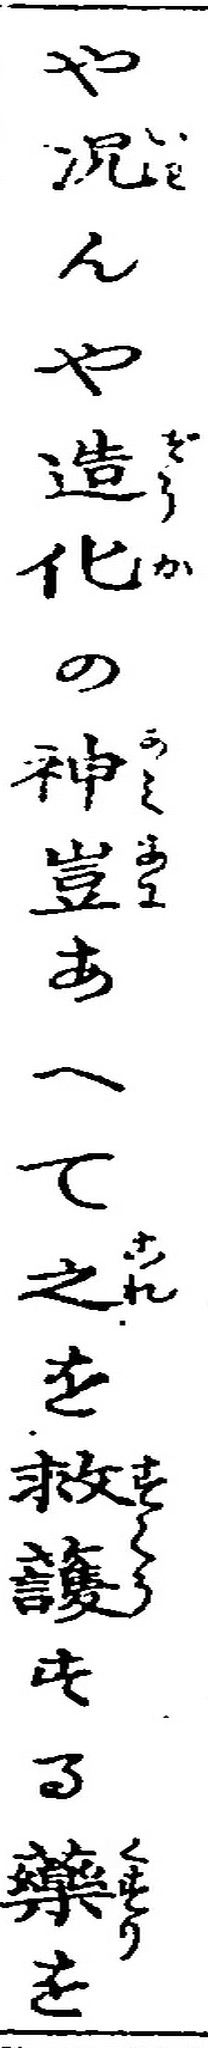や況んや造化の神豈あへて之を救護する藥を
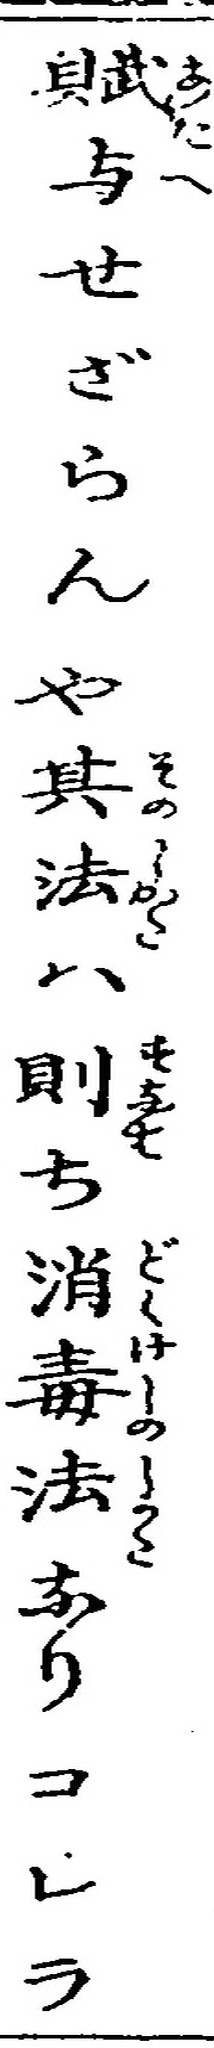賦与せざらんや其法は則ち消毒法なりコレラ
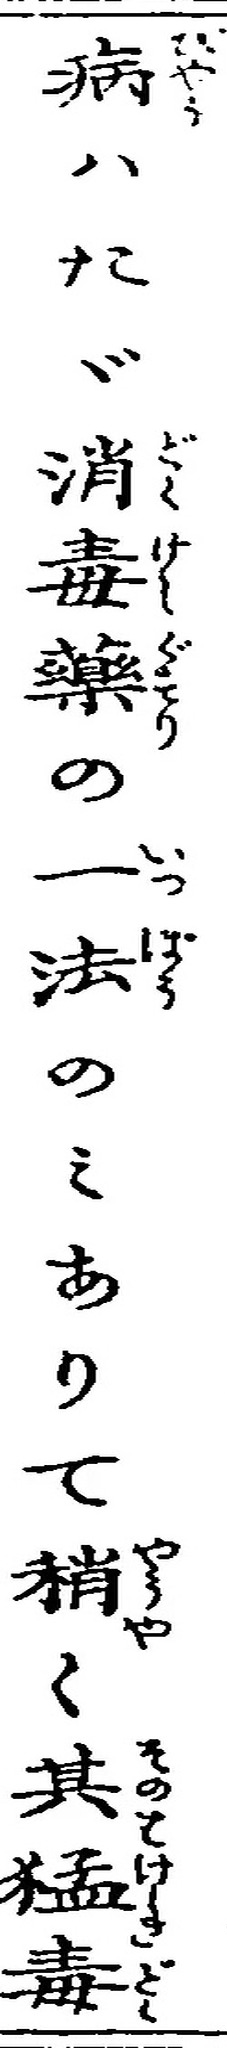病はたゞ消毒藥の一法のみありて稍く其猛毒
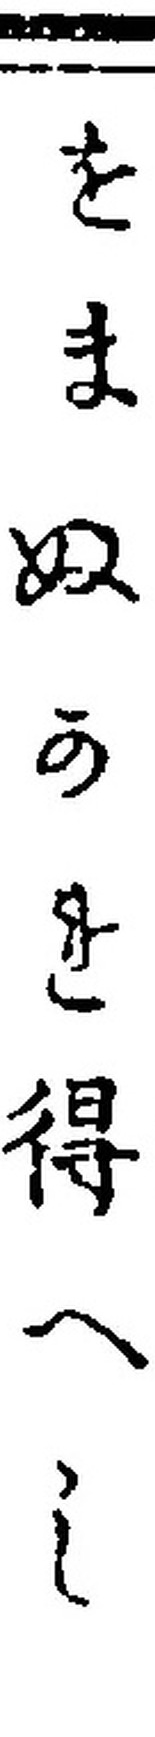をまぬかれ得へし

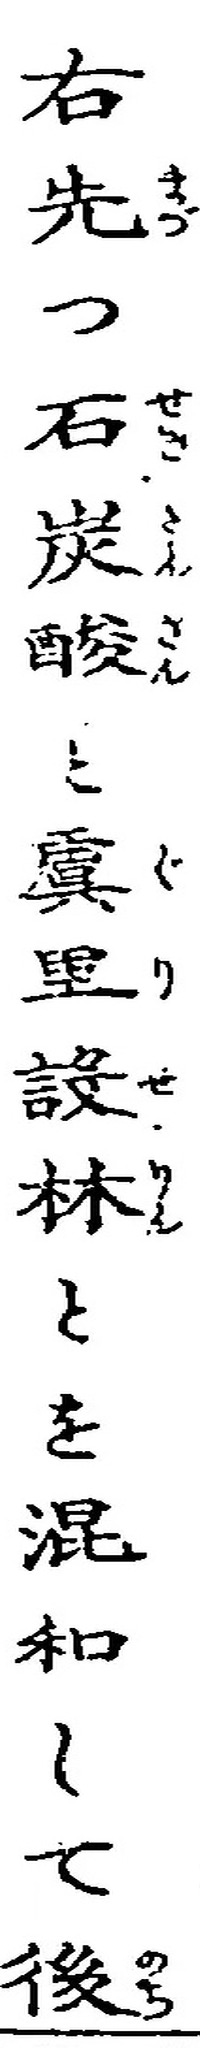右先石炭酸と虞里設林とを混和して後
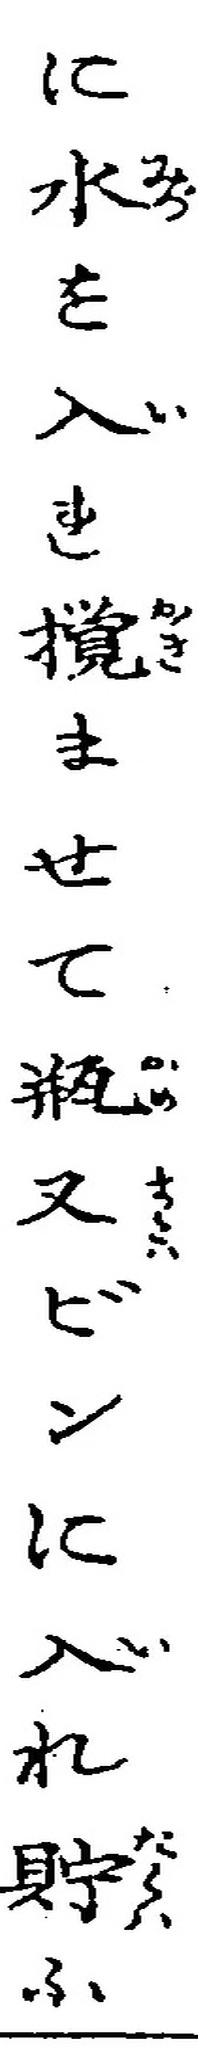に水を入れ攪ませて瓶又ビンに入れ貯ふ
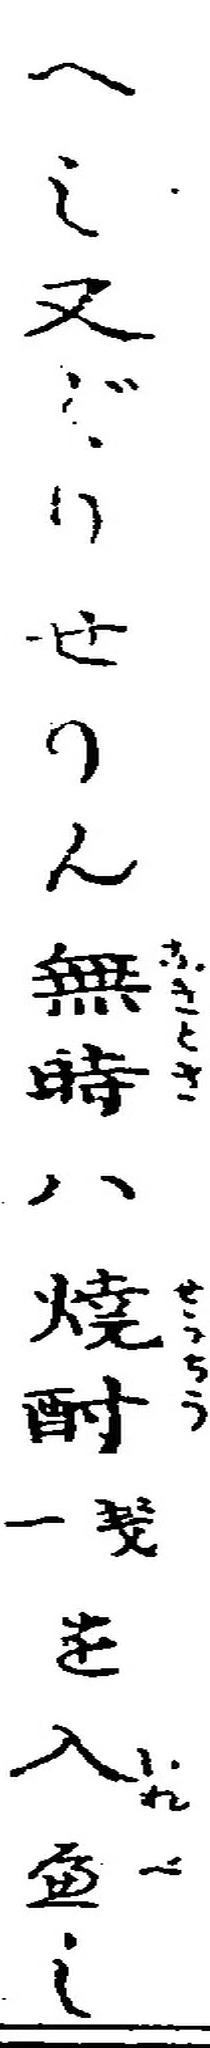へし又ぐりせりん無時は焼酎一を入べし
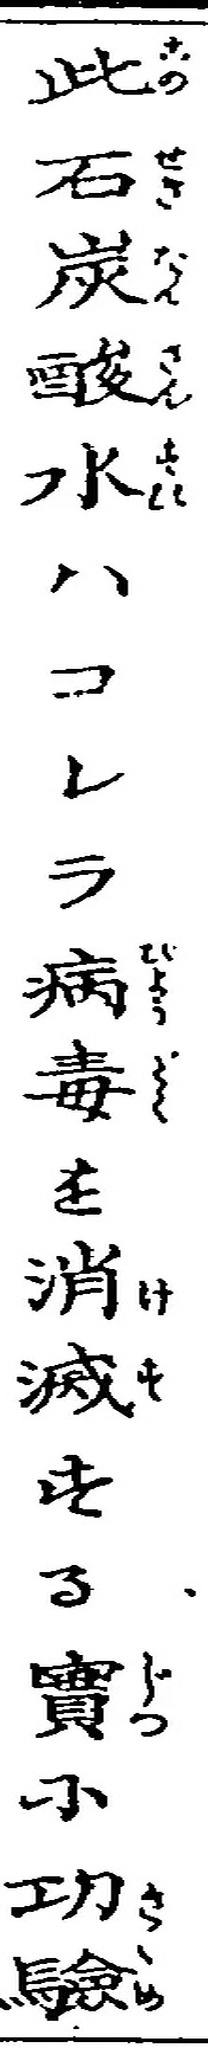此石炭酸水はコレラ病毒を消滅する實に巧験
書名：虎列剌予防民間の心得
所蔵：国立国会図書館 National Diet Library, JAPAN
